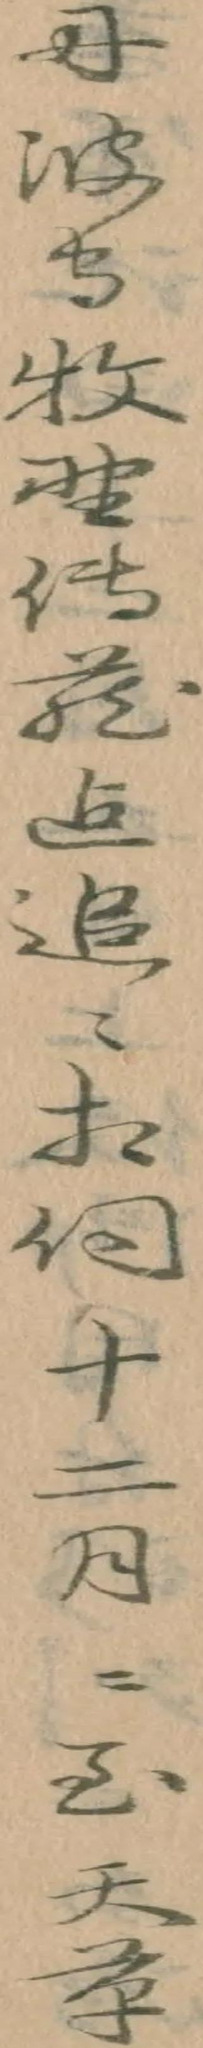丹波守牧野伝蔵迄追々相伺十二月に至天草
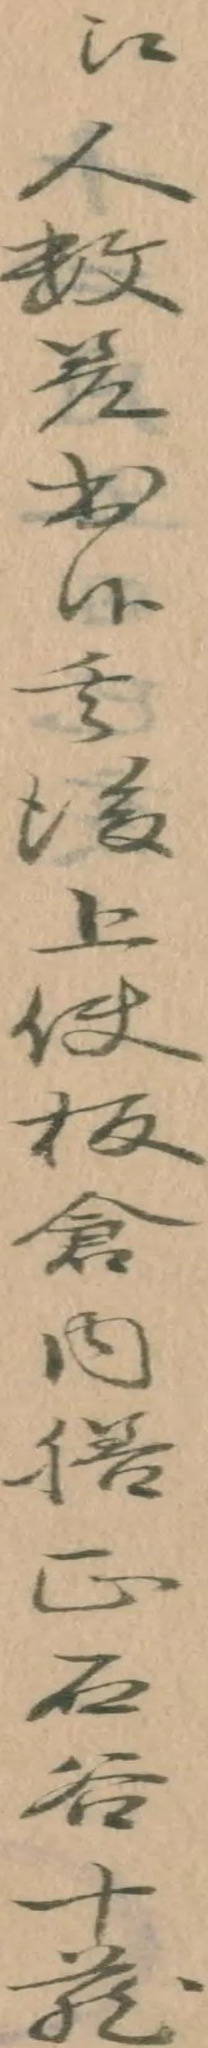江人数差出候其後上使板倉内膳正石谷十蔵
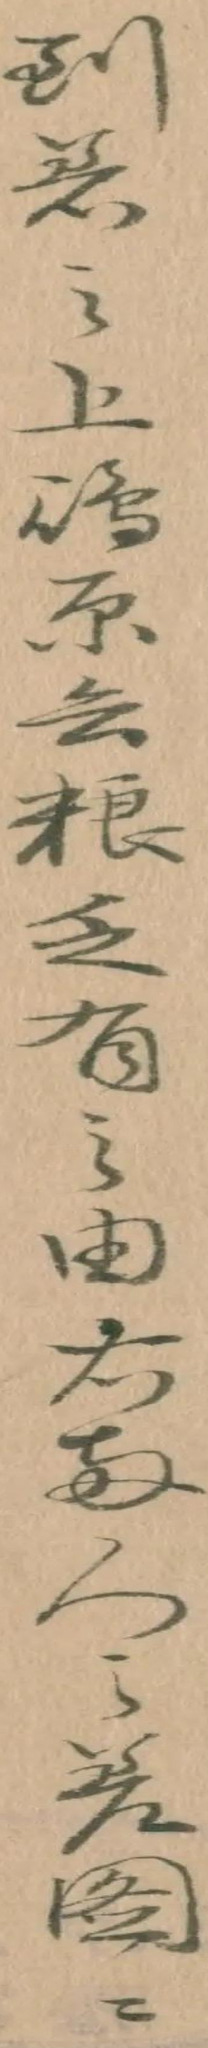到着之上島原兵粮乏有之由右両人之差図に
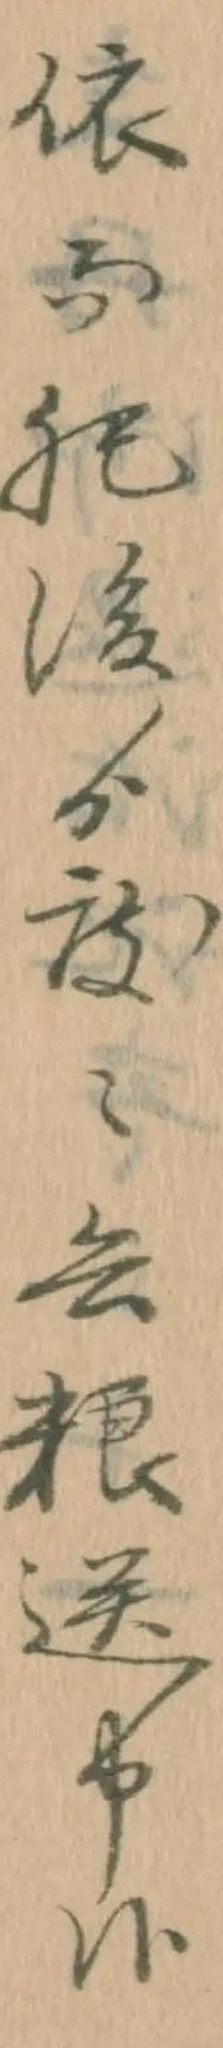依而肥後ゟ度々兵粮送申候
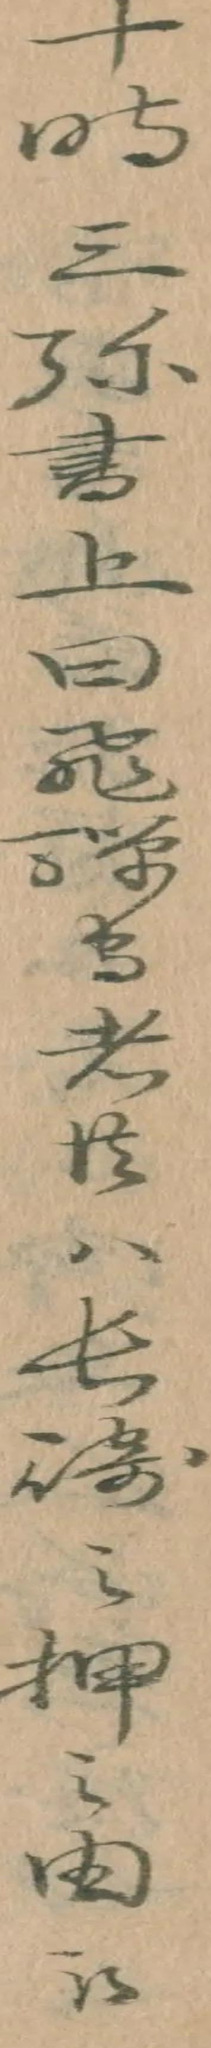十時三弥書上曰飛騨守者共は長崎之押之由被
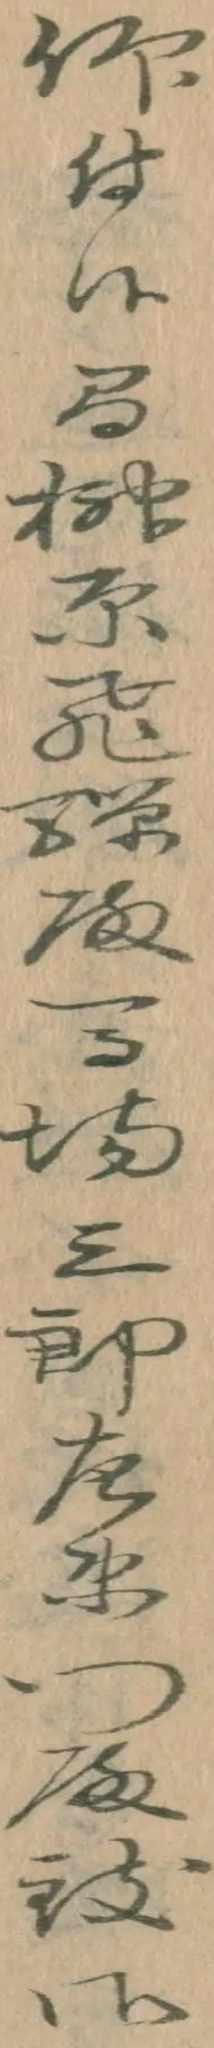仰付候間榊原飛騨殿馬場三郎左衛門殿致御
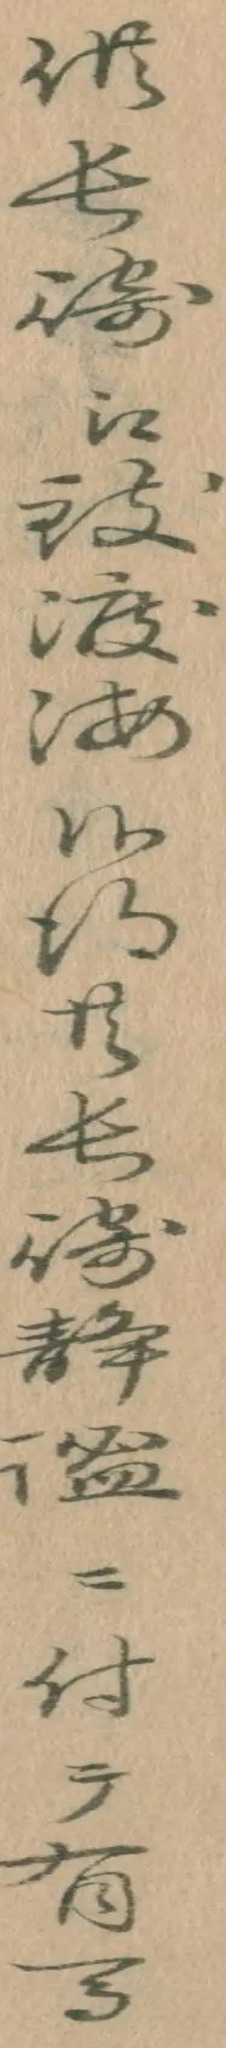供長崎江致渡海候得共長崎静謐に付て有馬
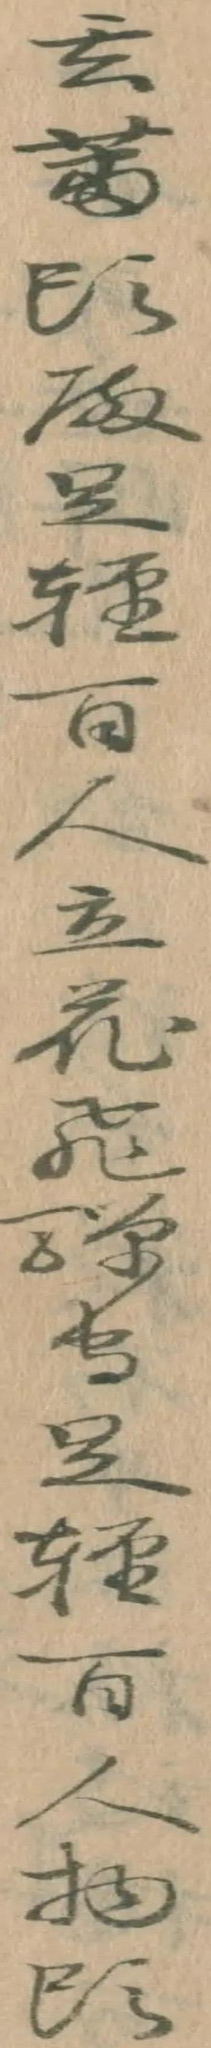玄蕃頭殿足軽百人立花飛騨守足軽百人物頭
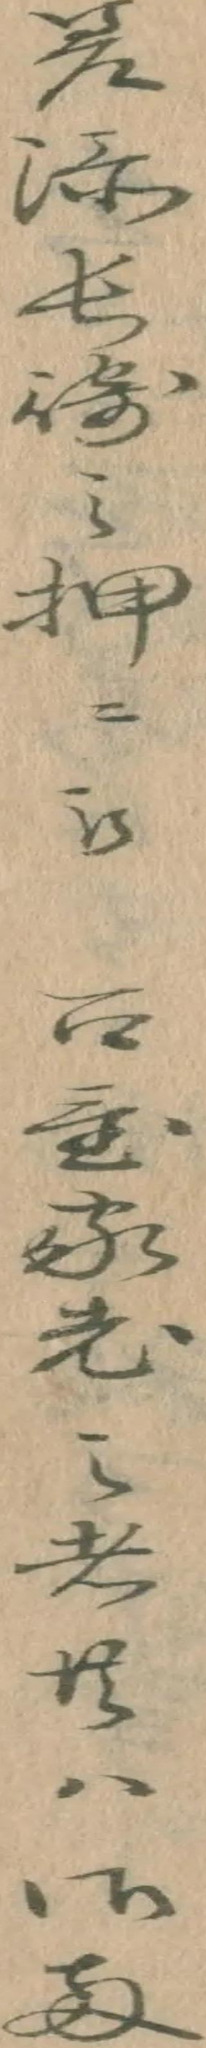差添長崎之押に被召置家老之者共は御両
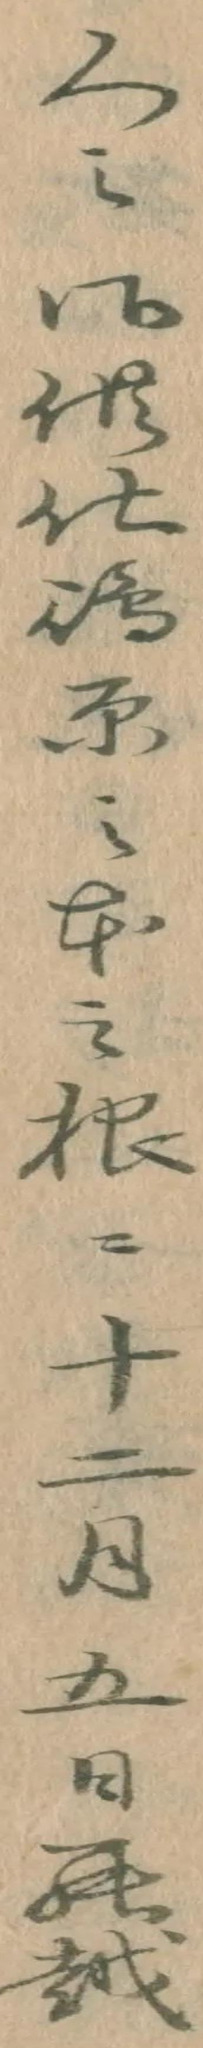人之御供仕島原之本之根に十二月五日罷越
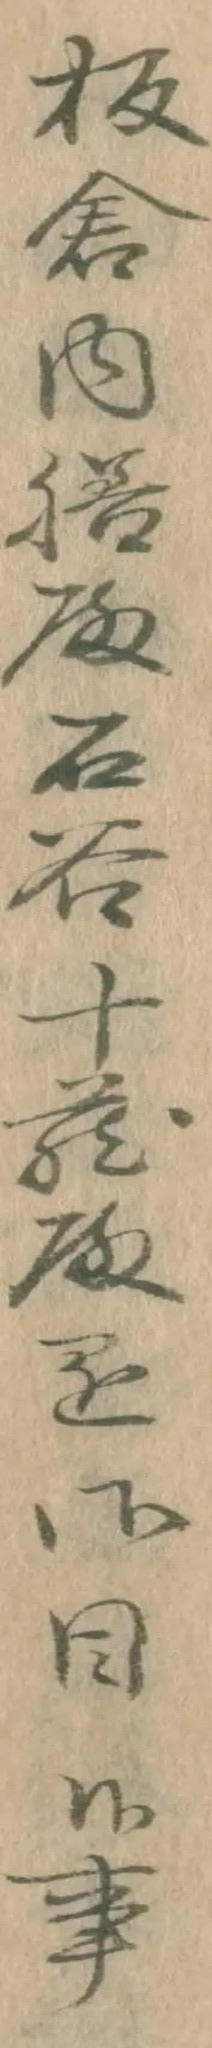板倉内膳殿石谷十蔵殿懸御目候事
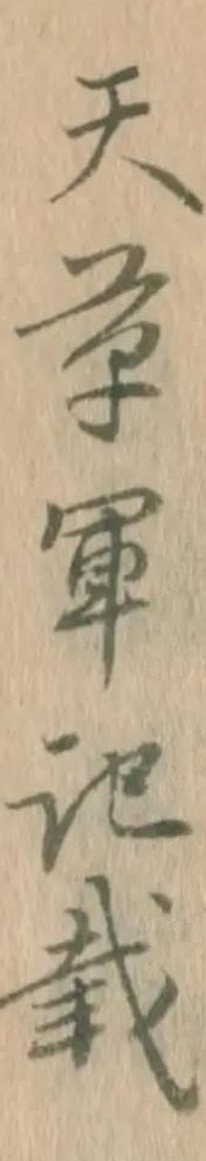天草軍記載
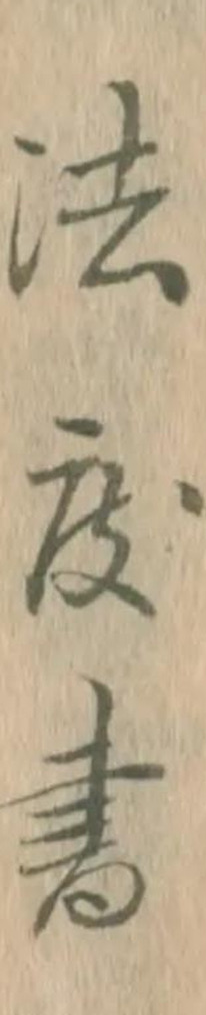法度書
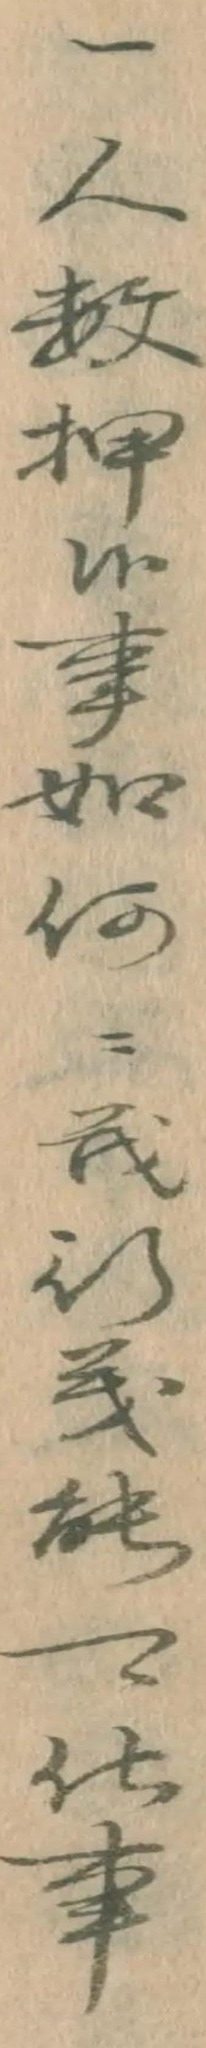一人数押候事如何にも行義能可仕事

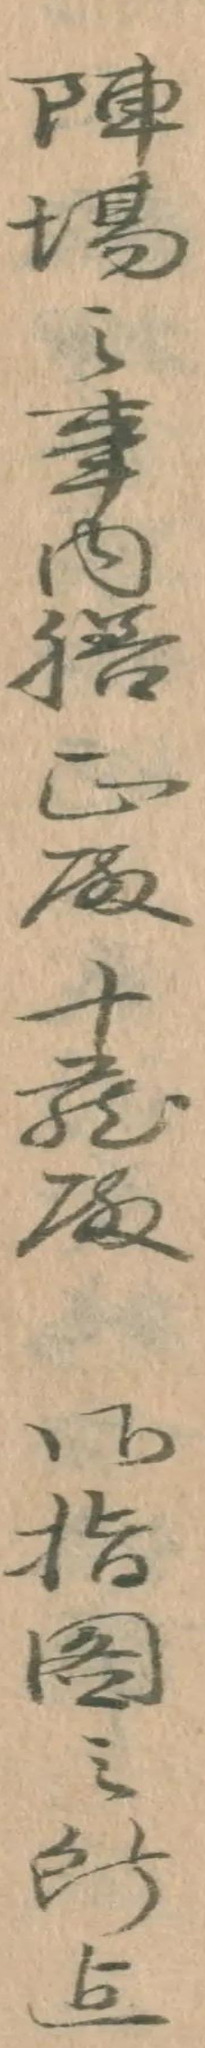一陣場之事内膳正殿十蔵殿御指図之所迄
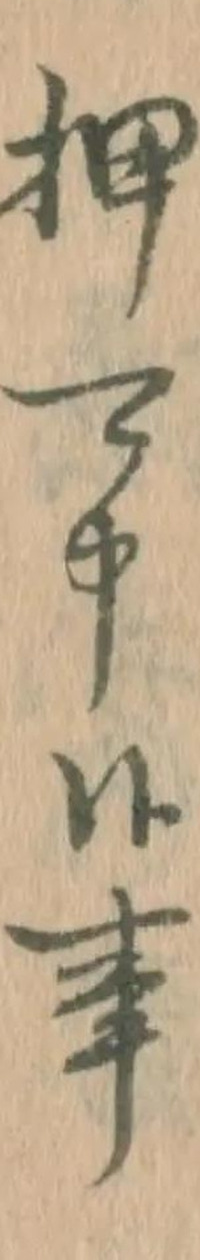押可申候事
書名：切支丹御退治記 49巻. [3]
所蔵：国立国会図書館 National Diet Library, JAPAN
